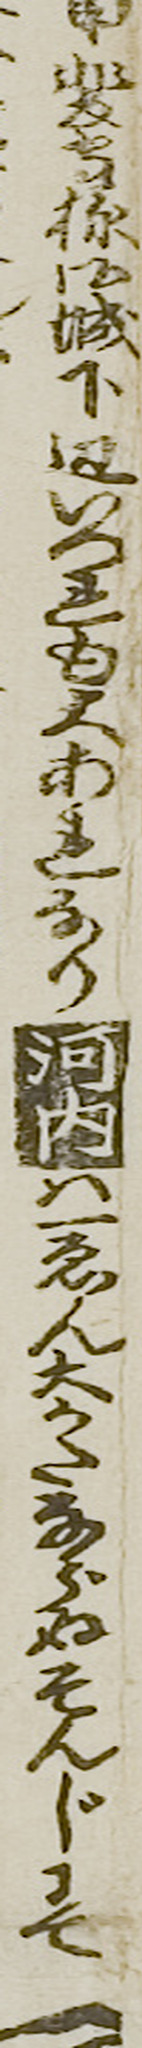辺郡山松平甲斐守様御城下辺いつれも大あれなり河内ハ一ゑん大かたならぬそんじにて
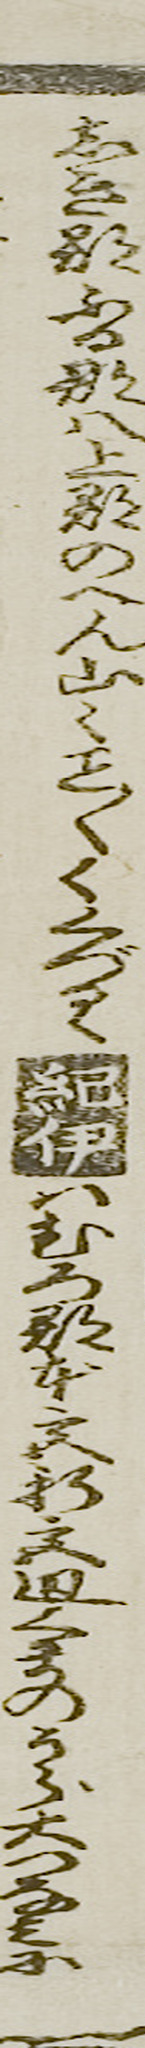しき郡ふる郡八上郡のへん山々こと〳〵くくづるゝ紀伊ハむろ郡本宮新宮辺くまのうら大つなミに
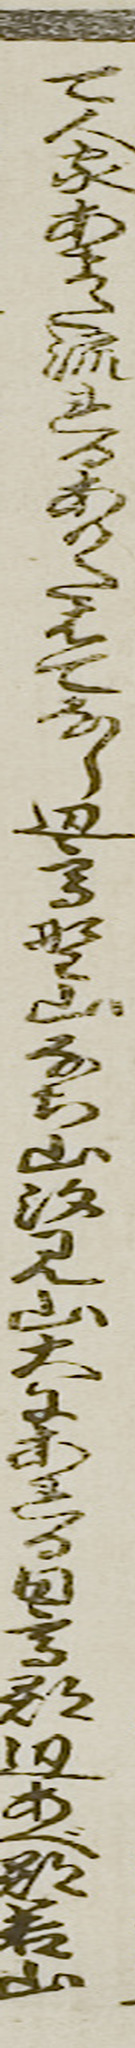て人家あまた流れるありたはてなし辺高野山なち山汐見大にあれる日高郡辺あべ郡若山
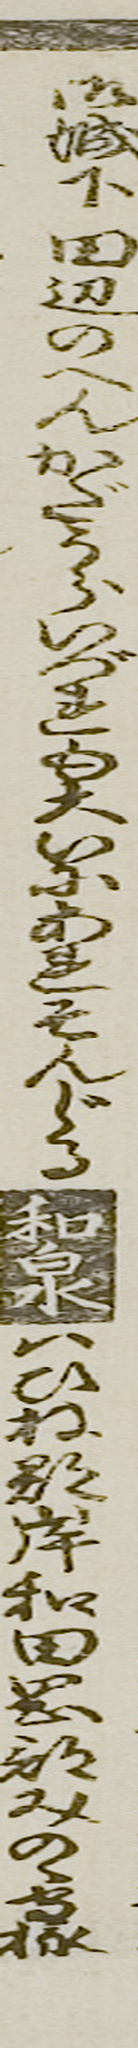御城下田辺のへんかだうらいづれも大いにあれそんじる和泉ハひね郡岸和田岡部みのゝ守様
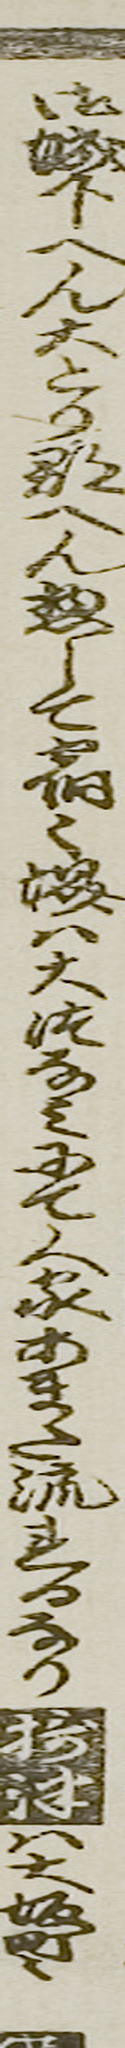御城下へん大とり郡へん惣して宿々堺ハ大つなミに人家あまた流れるなり摂津は大阪町〻
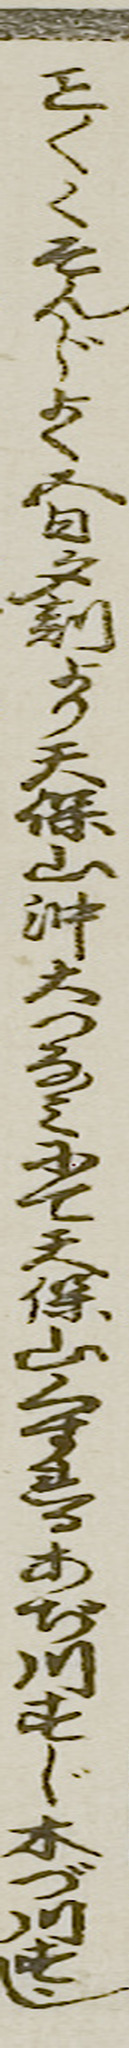こと〳〵くそんじよく五日夕刻より天保山沖大つなみにて天保山くすれるあぢ川すじ木づ川すじ
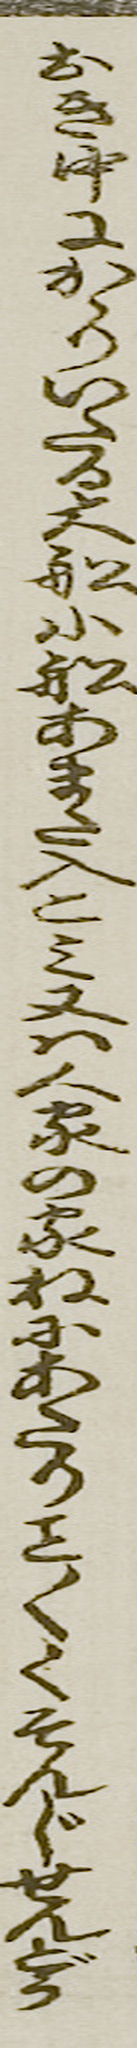おき中にかゝりいたる大船小船あまた入こミ又は人家の家ねにあたりこと〳〵くそんじせんどう
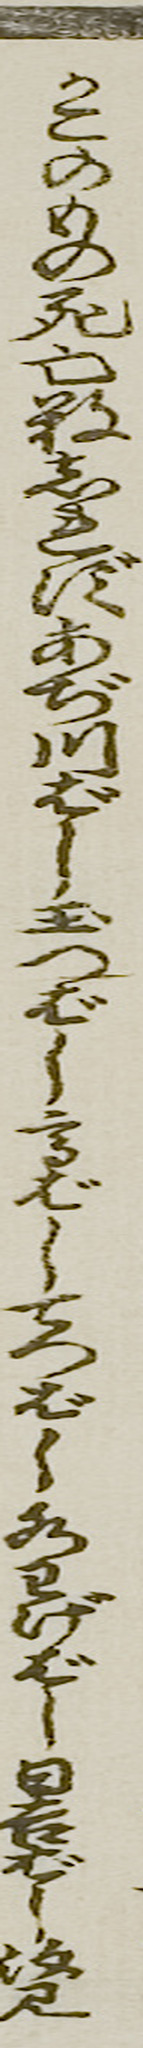かこのもの死亡数しれずあぢ川ばし玉つばし高ばしてつばし水わげばし日吉ばし汐見
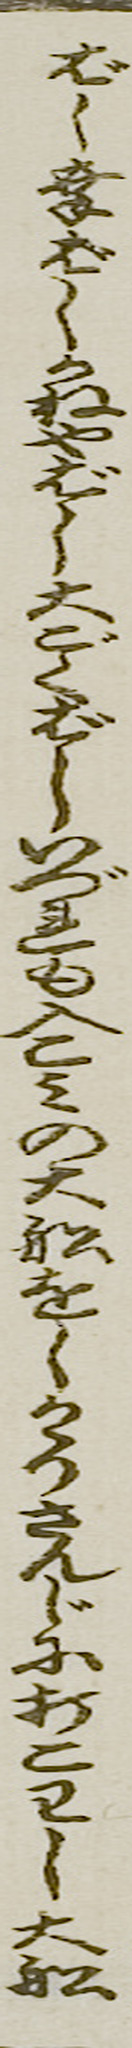ばし幸ばしかねやばし大ごくばしいづれも入こミの大船をしかゝりさんじに打こわし大船
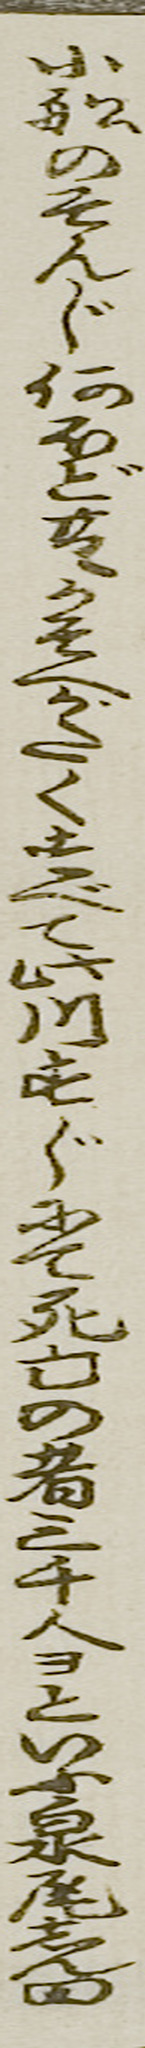小船のそんじ何ほど共かそへがたくすべて此川すじに死亡の者三千人ヨといふ泉尾しん田
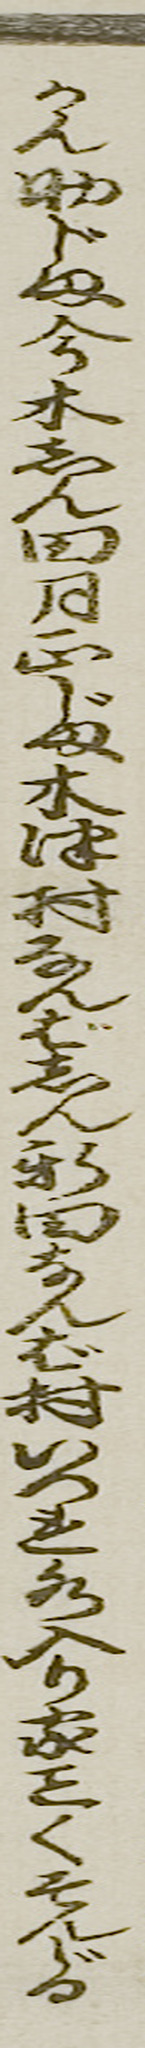かん助じま今木しん田月正じま木津村なんば新田なんば村いつれ水入り家こと〳〵くそんじる
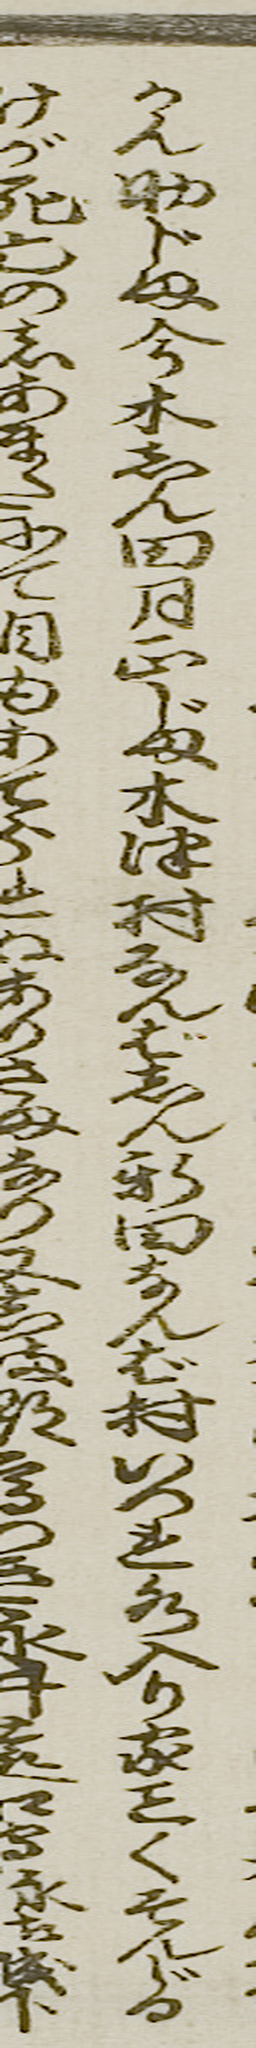けが死亡の者あまたにて目もあてられぬありさまなり又志満郡高つき永井遠江守様御城下
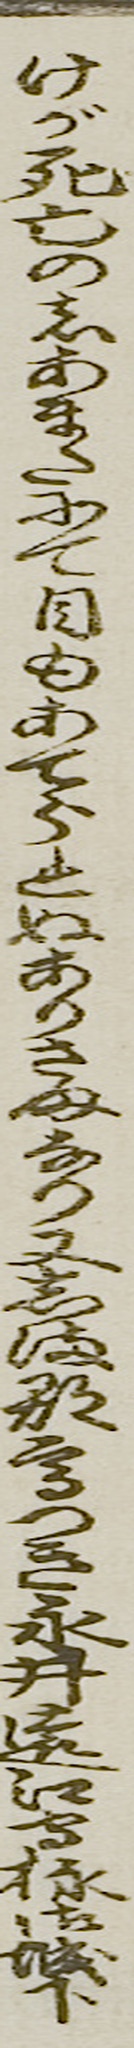けが死亡の者あまたにて目もあてられぬありさまなり又志満郡高つき永井遠江守様御城下
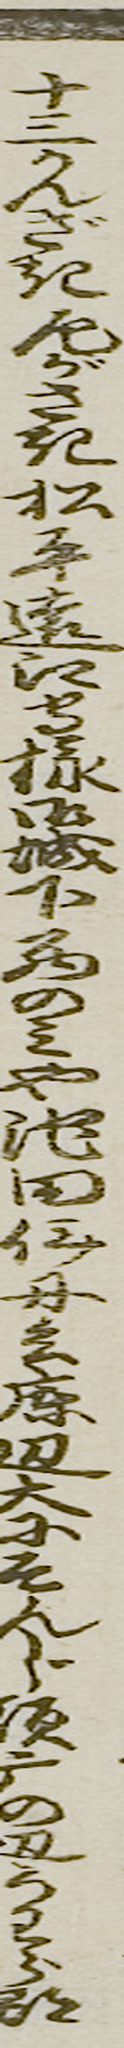十三かんざき尼がさき松平遠江守様御城下西のミや池田伊丹兵庫辺大にそんじ須磨の辺うわら郡
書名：諸国大地震之図
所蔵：東京大学総合図書館 General Library in the University of Tokyo, JAPAN
